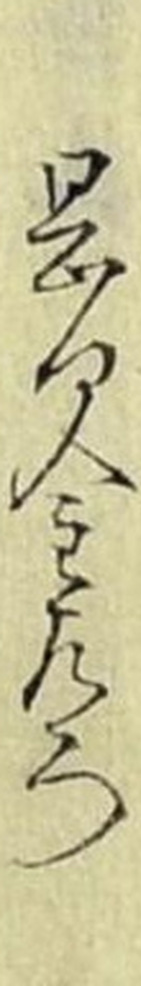岡田金左衛門
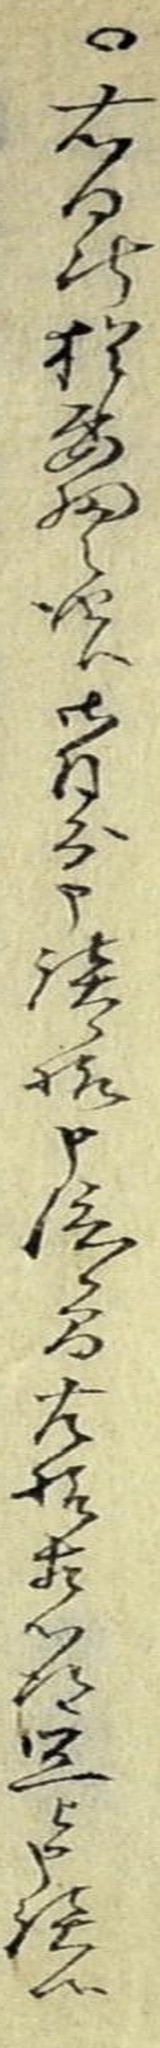右同断猶委細之儀は御自分申談候様申渡候間左様相心得宜被申談候
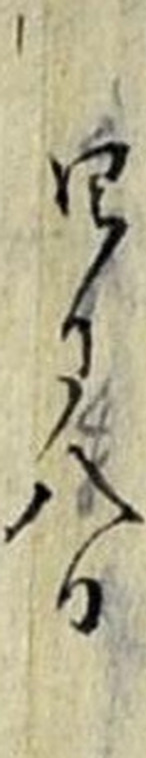四月八日
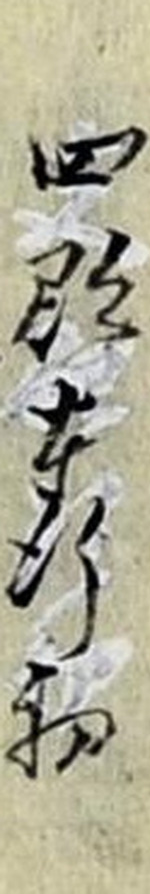四郡奉行初
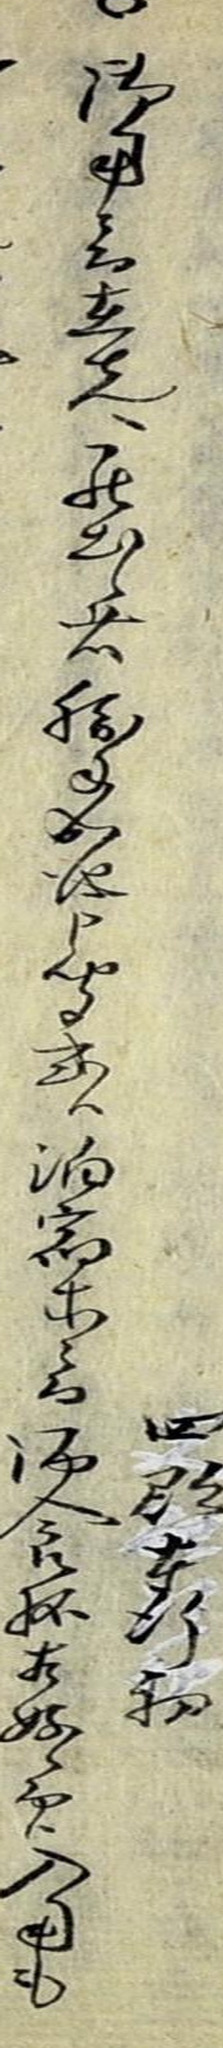○御用に而在先へ罷出候者勝手成儀申聞或は泊宿等に而酒合抔相始候而は入用も
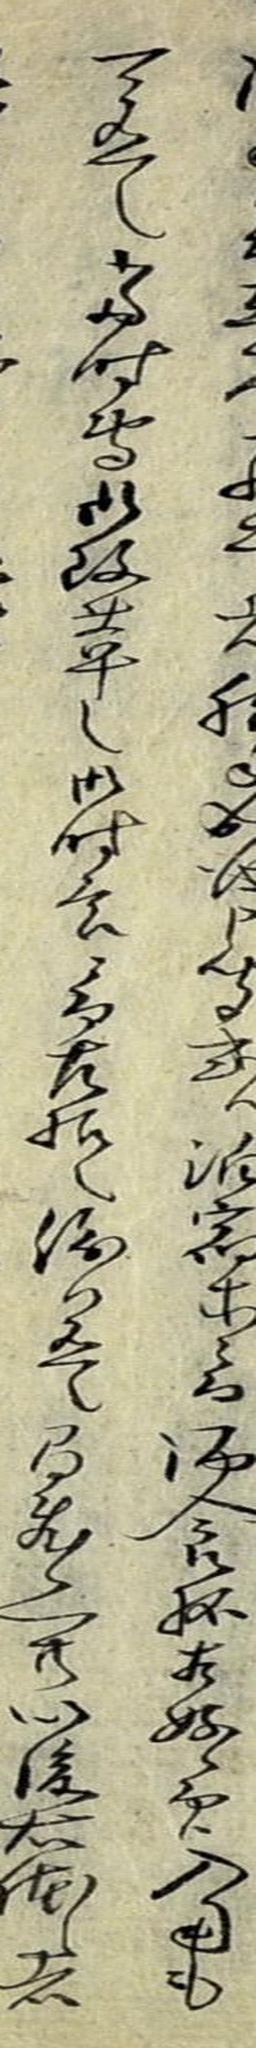可有之当時専御改革之時節に而左様之儀は有之間敷候へ共以後右体之者
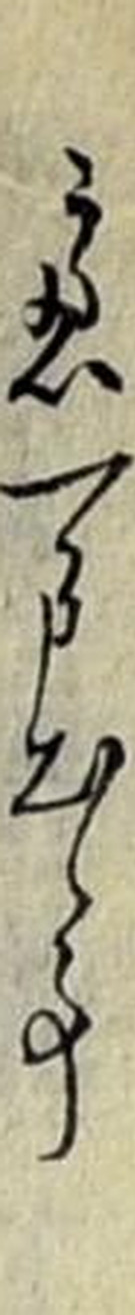慮可申出候事
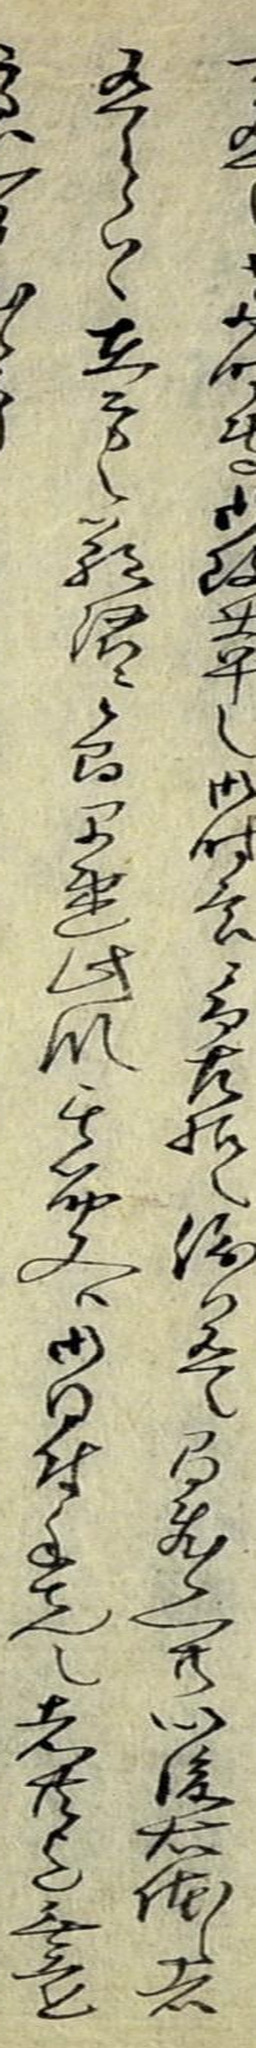有之候はヽ在方之難渋に候間早速此段其筋又は御目付手先之者共迄無遠
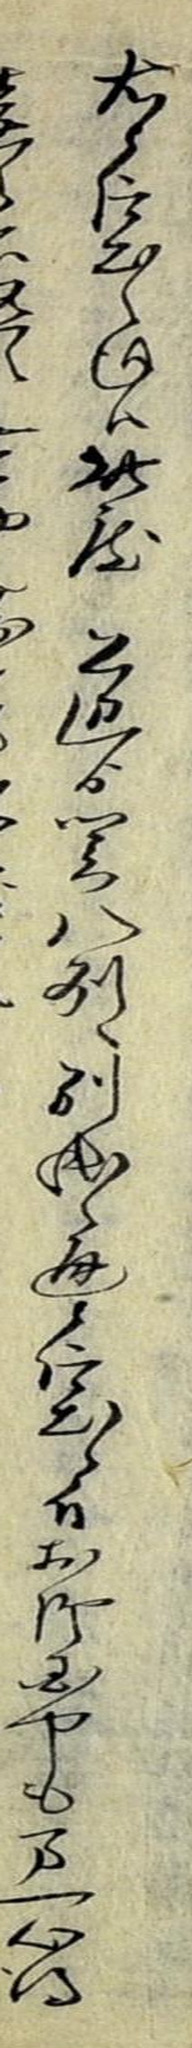右被仰出候趣は此度公辺ゟ関八州へ別紙之通被仰出候に付於御国中も万一心得
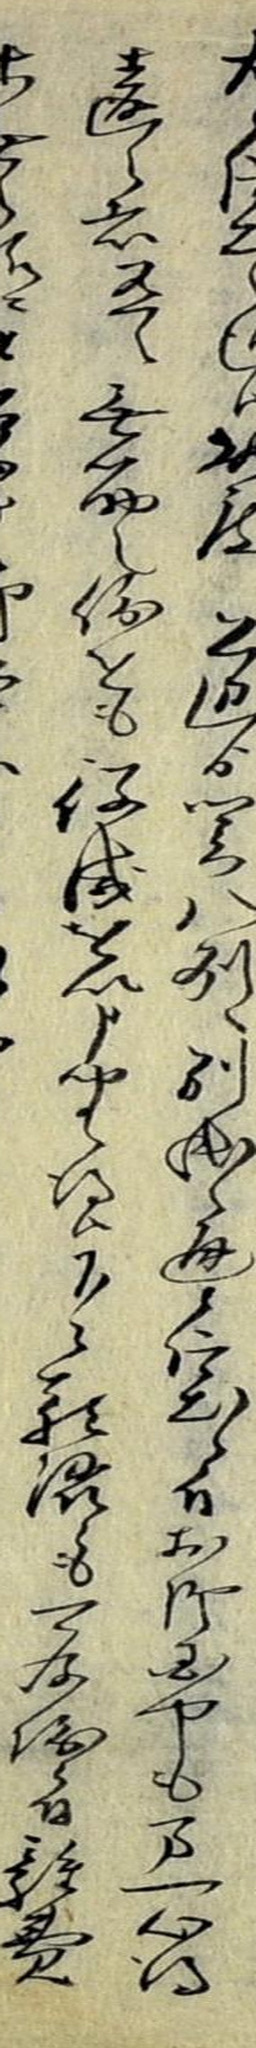違之者有之無筋之儀とも役儀を以申聞候得は下々難渋にも可及儀に付雑費
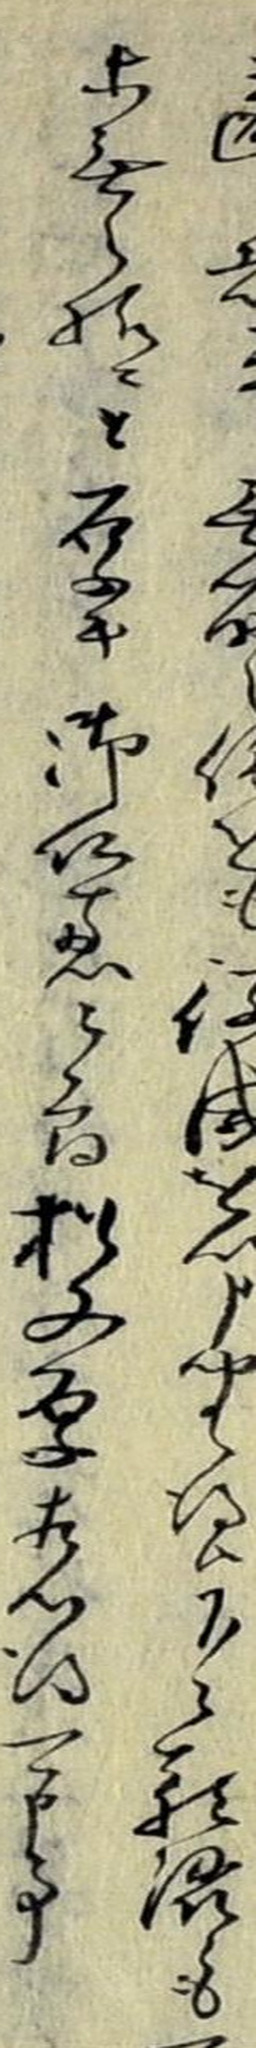等無之様にと厚キ御仁恵に候間猶又厚相心得可申事
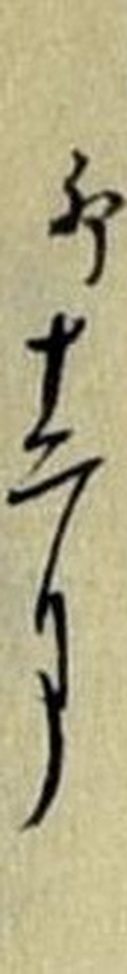卯十二月
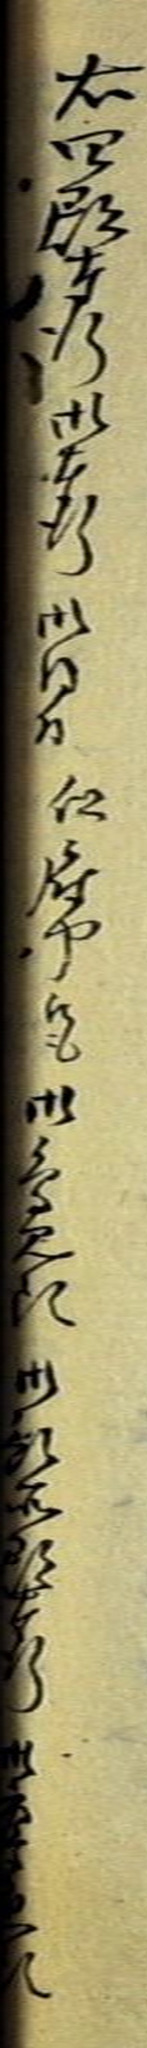右四郡奉行御奉行御目付但府中江も御鳥見頭御預郡奉行御鷹匠頭
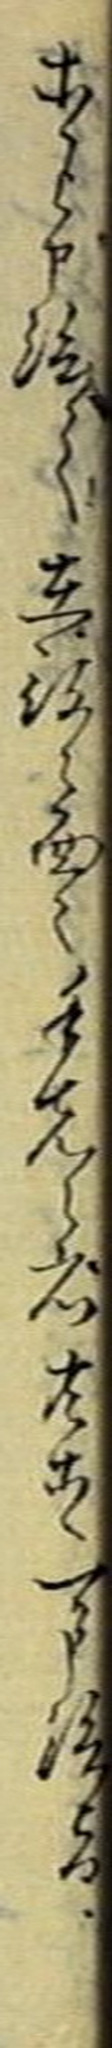等へ被申渡之在役之面々手先之者共等へ可申渡旨
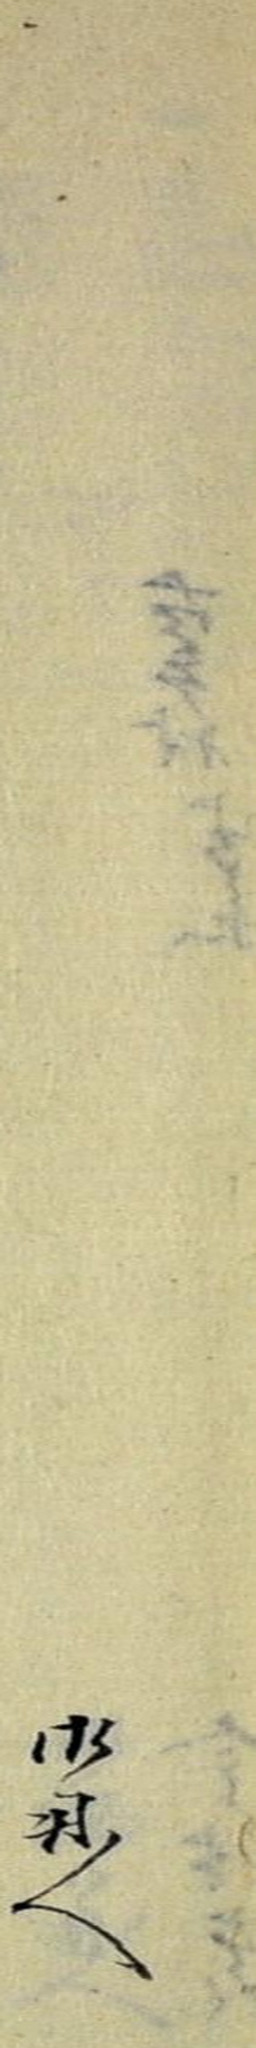御用人
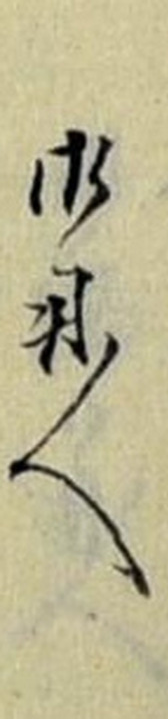御用人
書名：命令之部 六
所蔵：福井県文書館 Fukui Prefectural Archives
